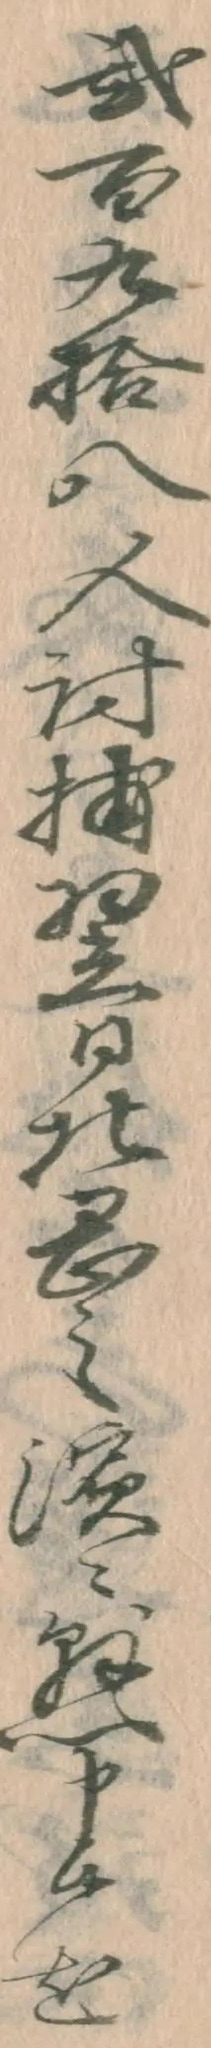弐百九拾八人討捕翌日北岡之浜に懸申候を
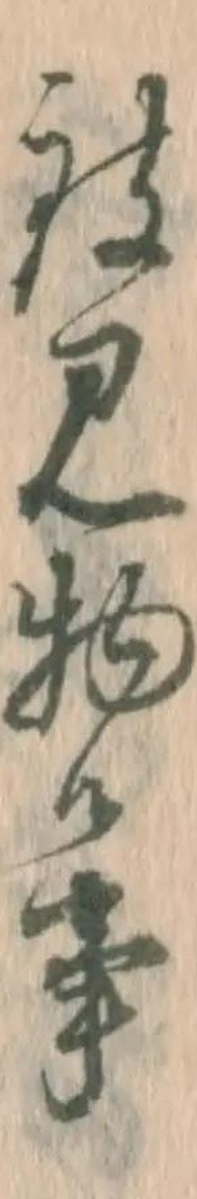致見物候事
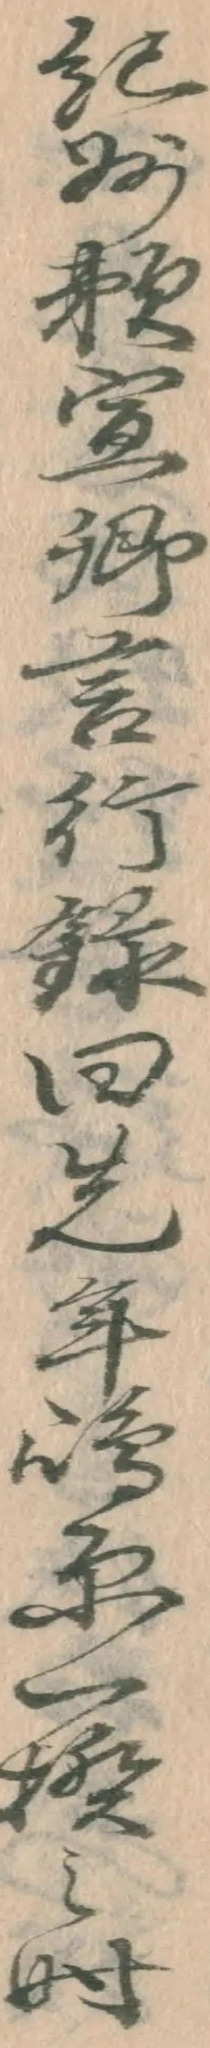紀州頼宣卿言行録曰先年島原一揆之時
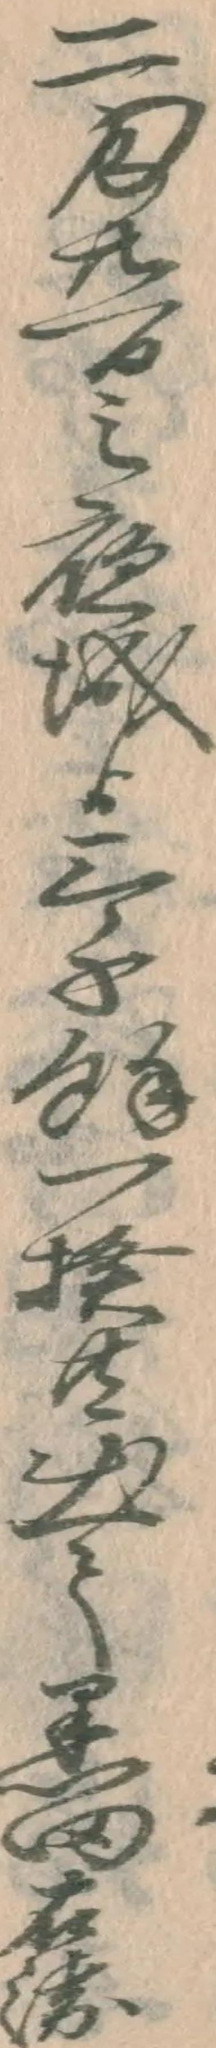二月廿一日之夜城ゟ三千余一揆共出て黒田右衛
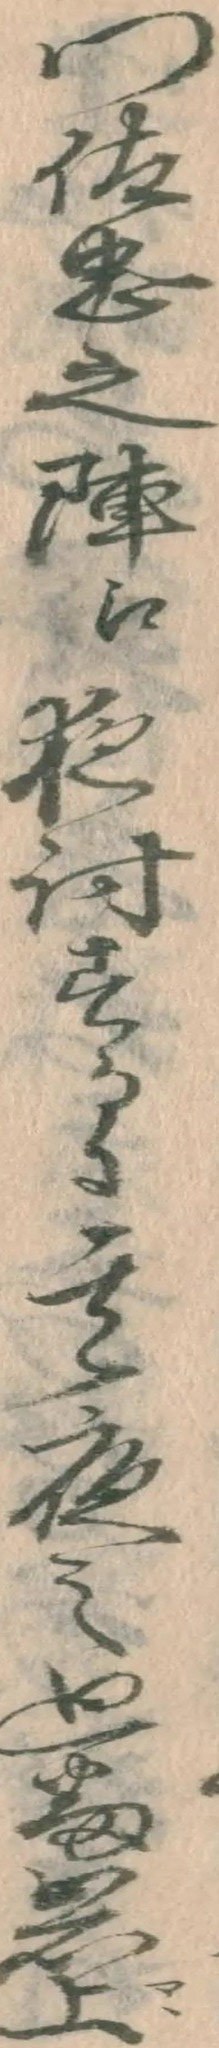門佐忠之陣江夜討春る尓其夜之廻番岩上
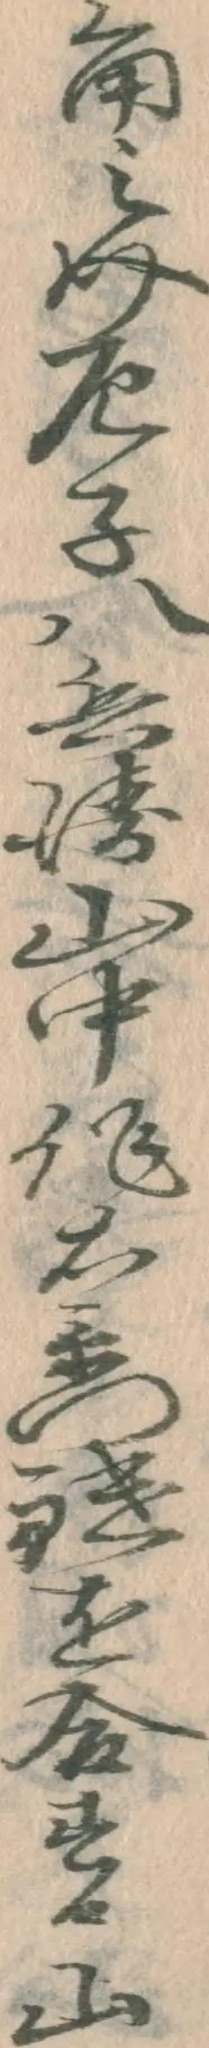角之介尼子八兵衛山中作右衛門鑓を合春る山
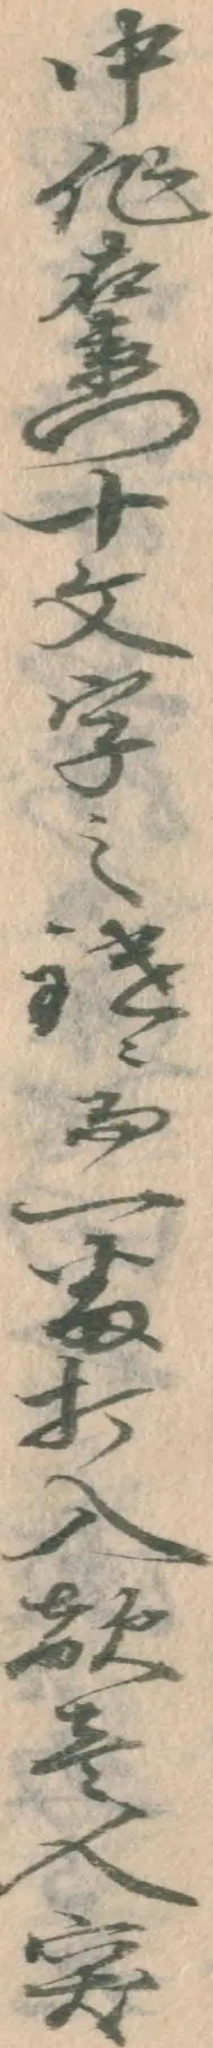中作右衛門十文字之鑓に而一番打入敵壱人突
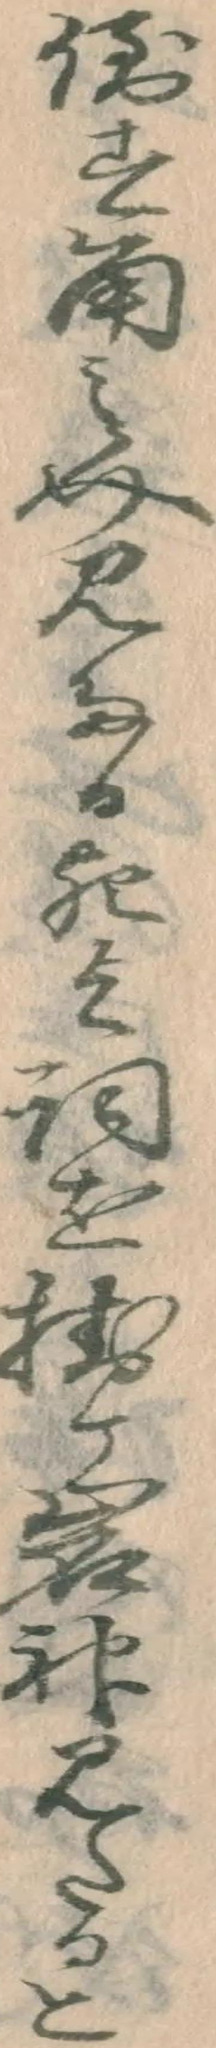倒春角之介見多る歟与詞を掛け岩神見たると
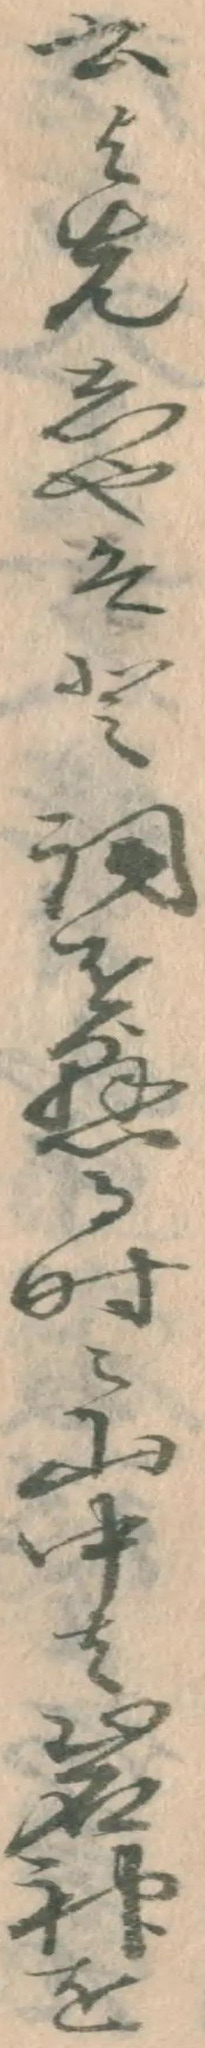云与先志やそ登詞を懸る時に山中者岩神を

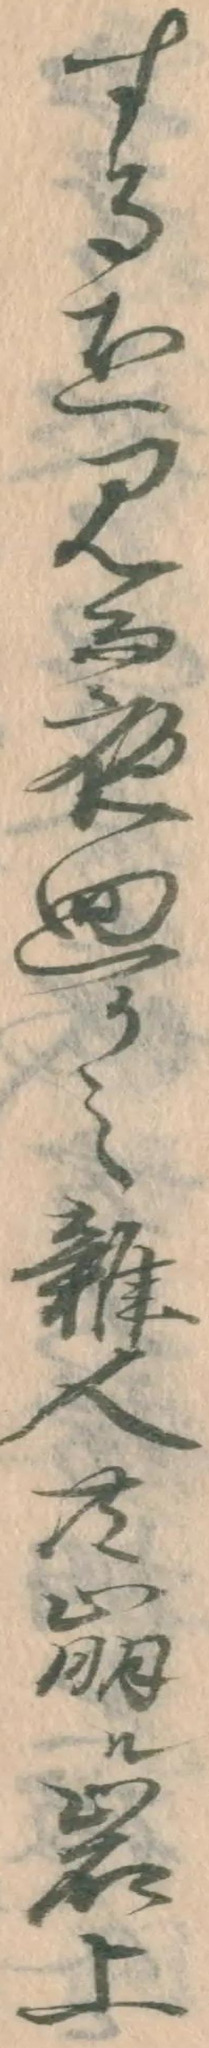するを見而夜廻り之雑人共崩る岩上
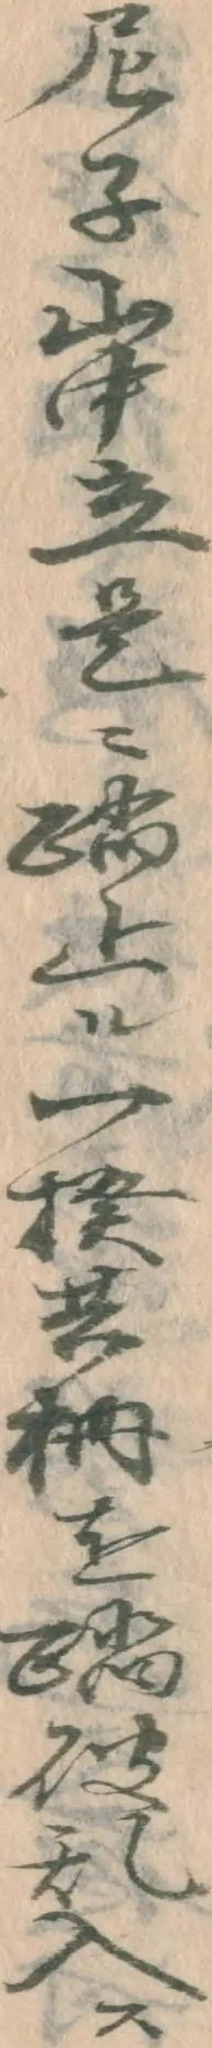尼子山中是に踏止る一揆共柵を踏破乱入す
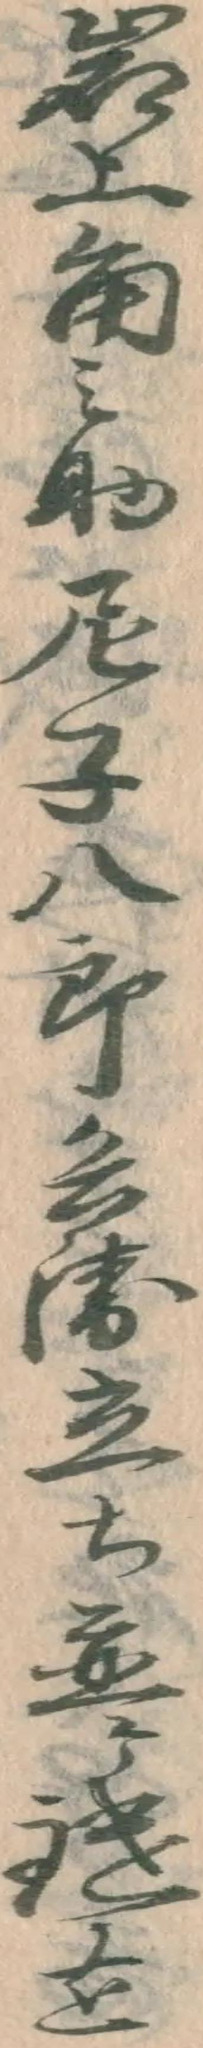岩上角之助尼子八郎兵衛立ちな並て鑓を
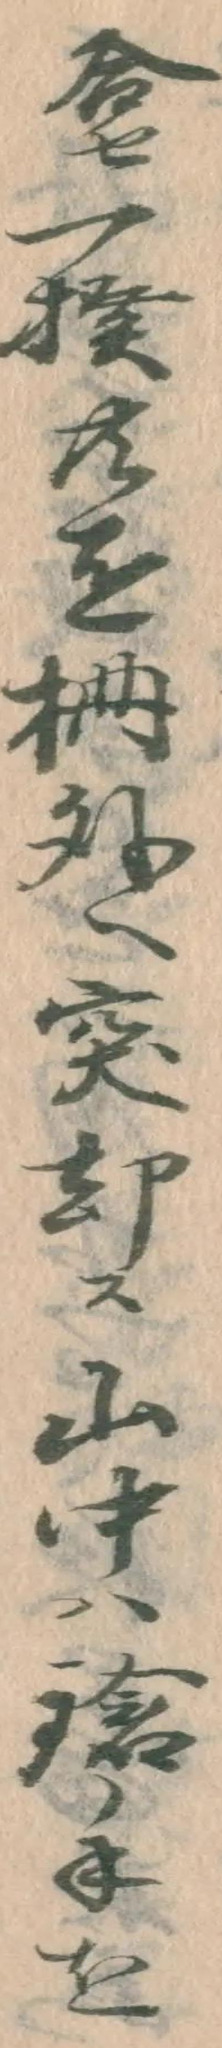合せ一揆共を柵外へ突却す山中は鎗之手を
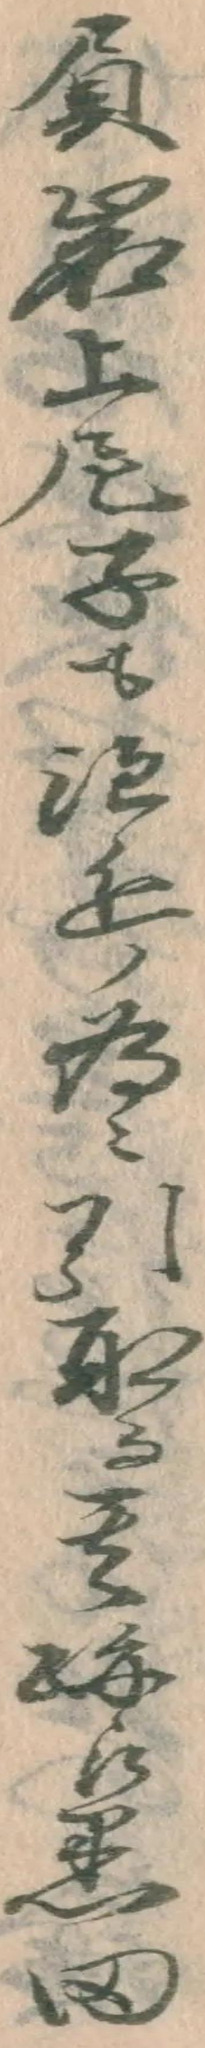負岩上尼子も注進之為に引取る其跡江黒田
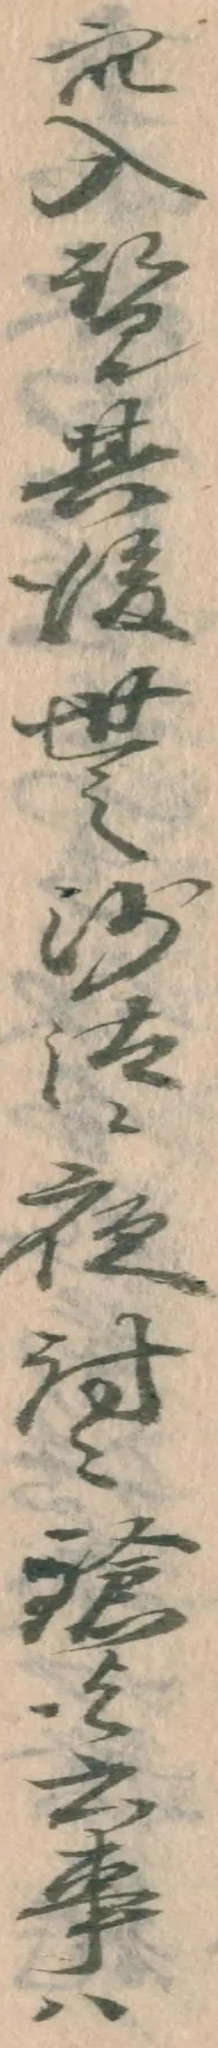衆入替る其後世之沙汰に夜討に鎗与云事は
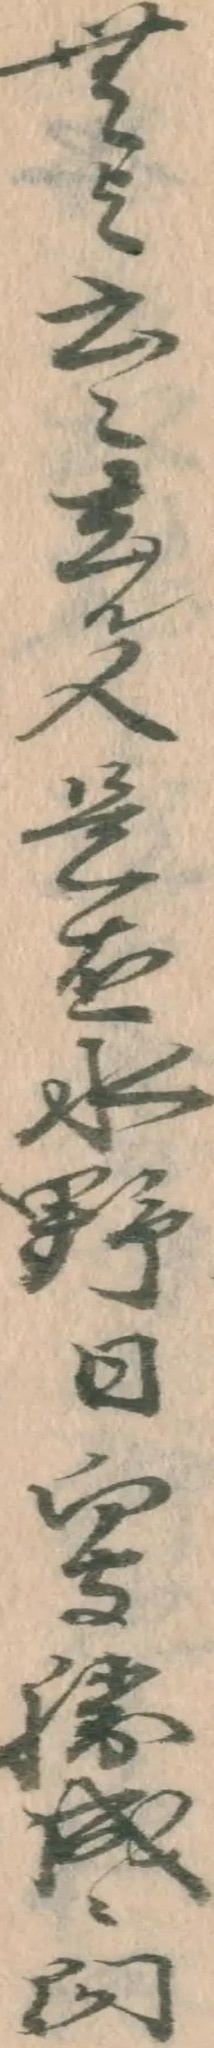無与云々去る人是を水野日向守勝成に問
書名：切支丹御退治記 49巻. [7]
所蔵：国立国会図書館 National Diet Library, JAPAN
